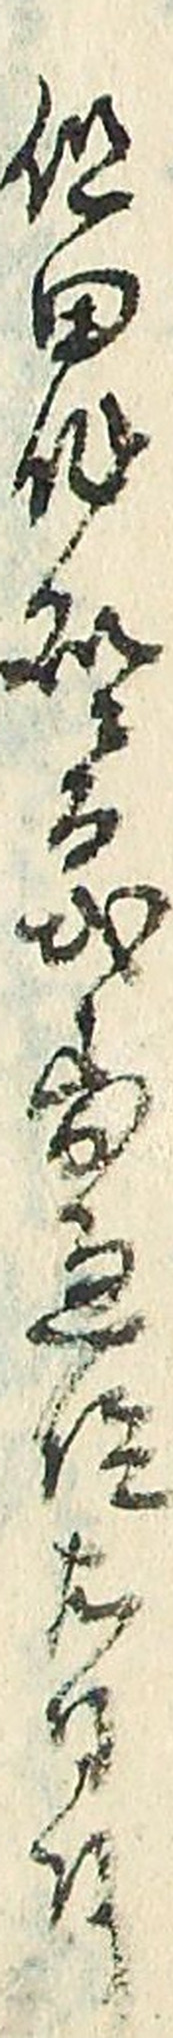但田作処ニ而弐歩通位右同断

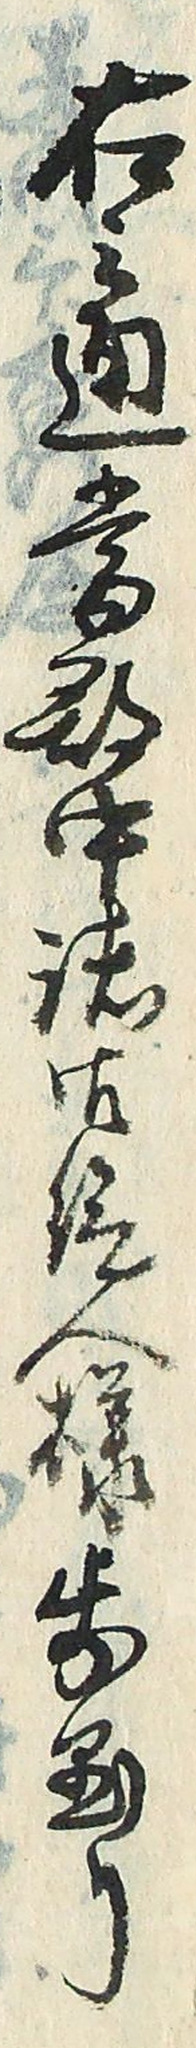右之通當郡中諸御給人様歩懸り
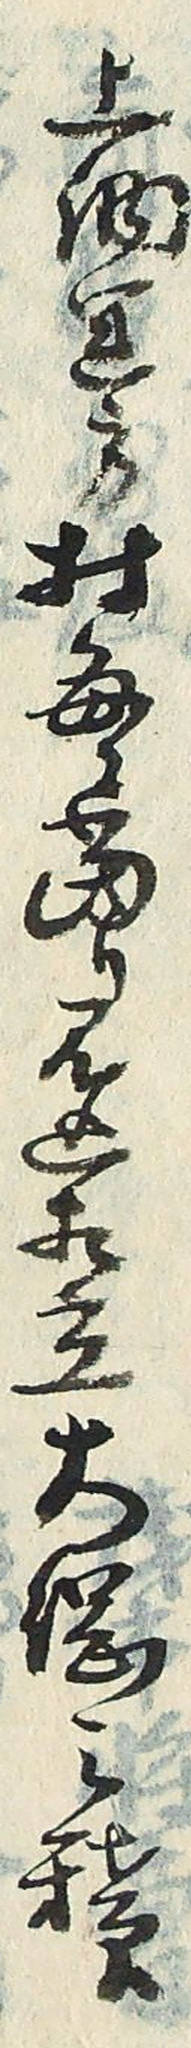上納運方村毎ニ當り見込相立大綱之積
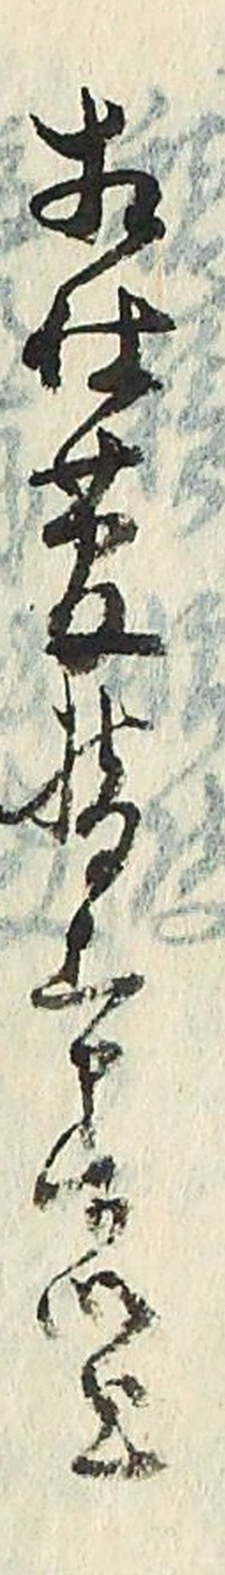相仕管指上申候以上
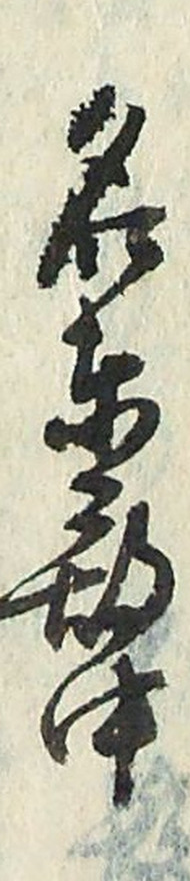名東郡中
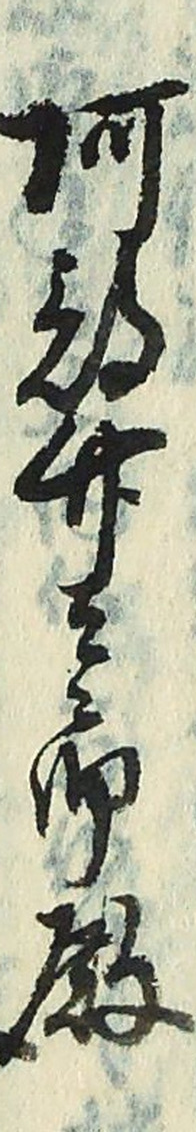阿部竹太郎殿
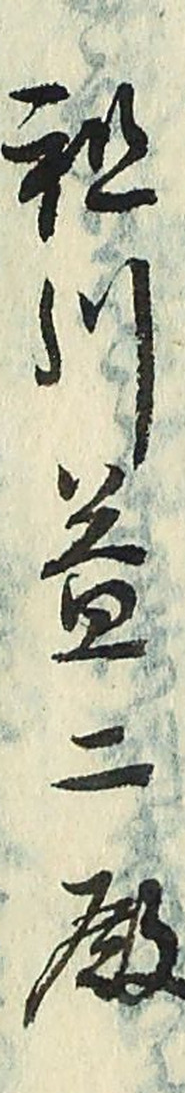祖川益二殿
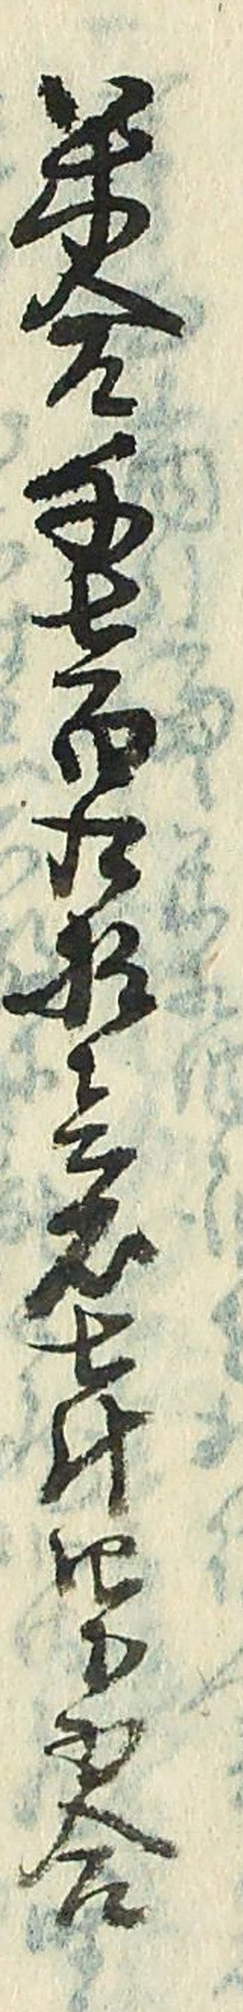米合千七百九拾壱石七斗四升五合
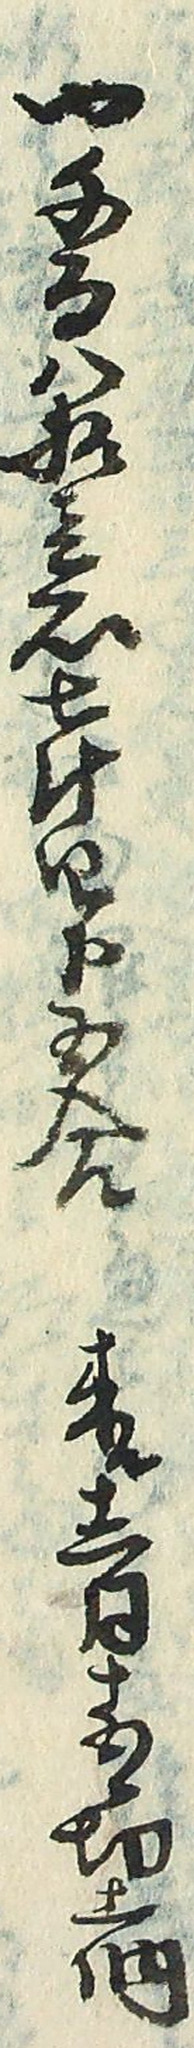内千百八拾壱石七斗四升五合来ル十二月十五日切上納
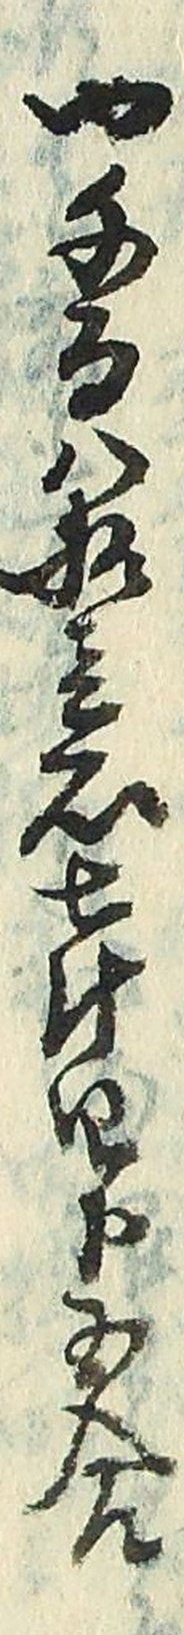米合千七百九拾壱石七斗四升五合
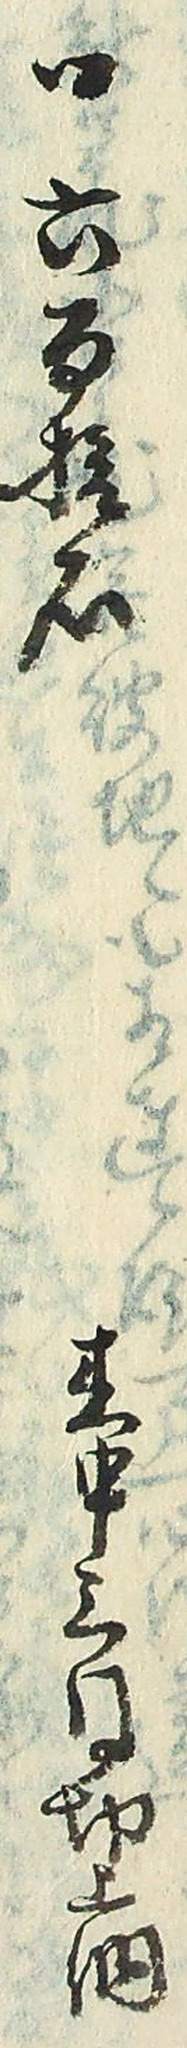内六百拾石来申三月切上納

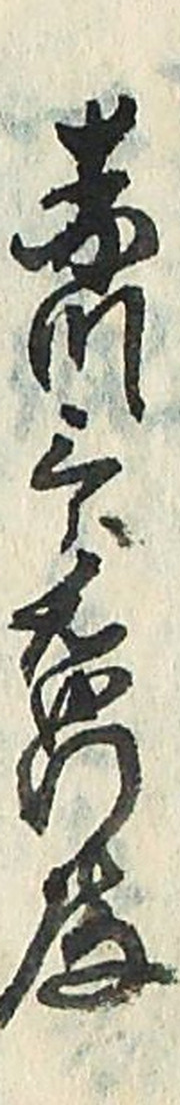赤川三郎右衛門殿
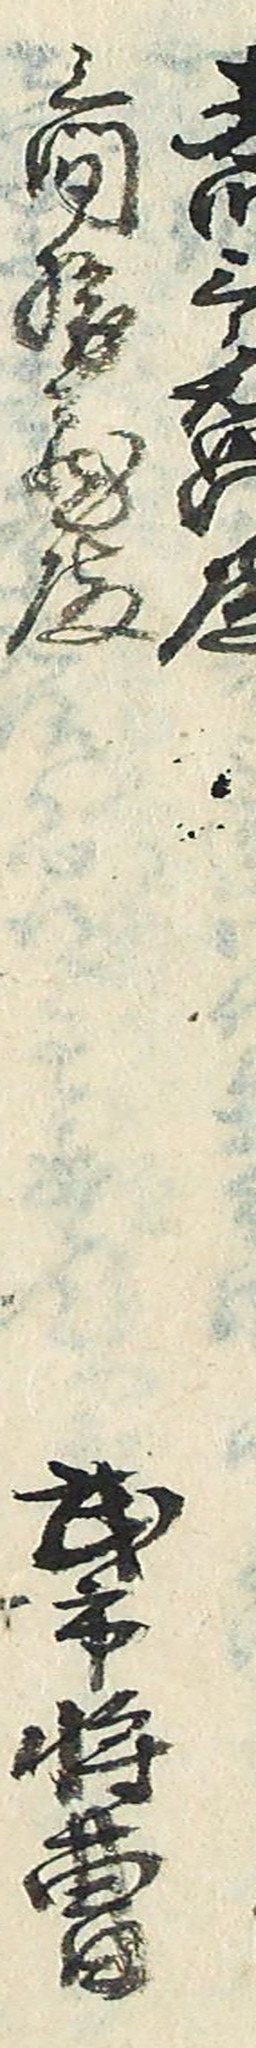三間勝蔵殿武市将曹
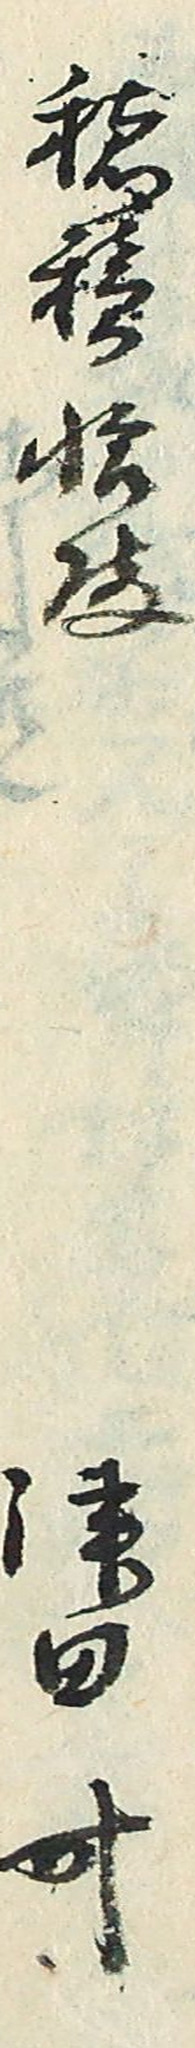穂積恰殿津田叶
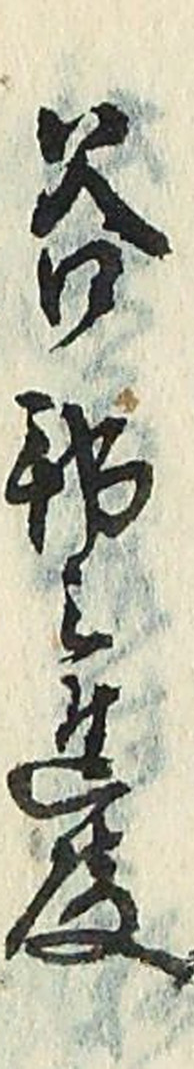谷邦之進殿
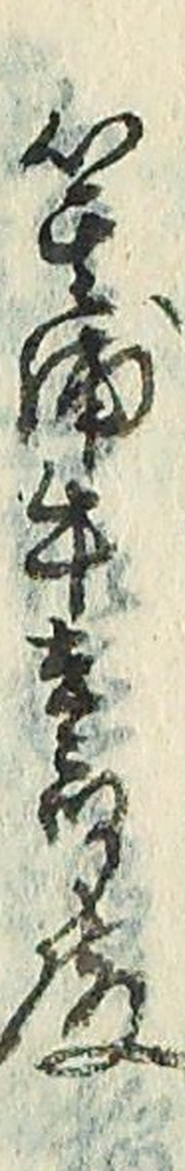箕浦牛太郎殿
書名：諸御趣意書并御下知向之写
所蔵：鳴門教育大学 Naruto University of Education
